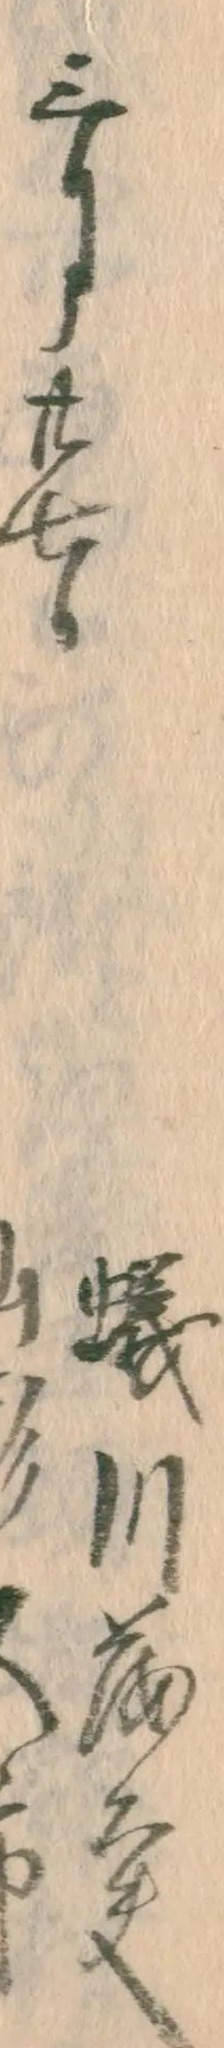三月廿七日蟻川茂太夫
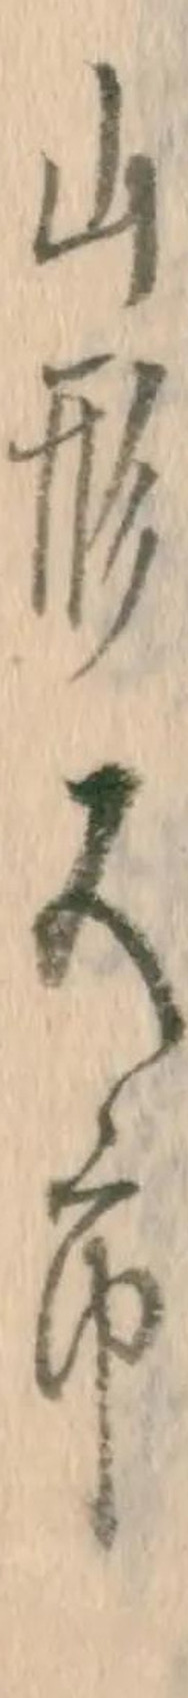山形又市
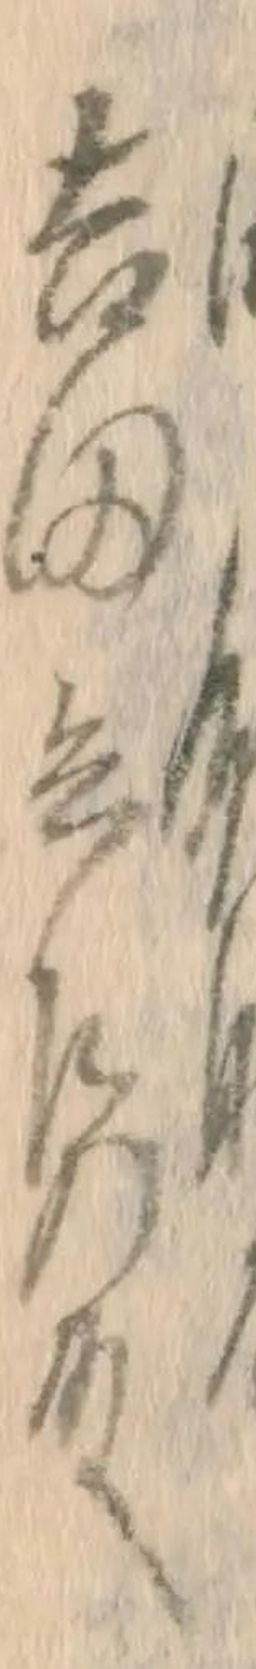吉田兵左衛門殿
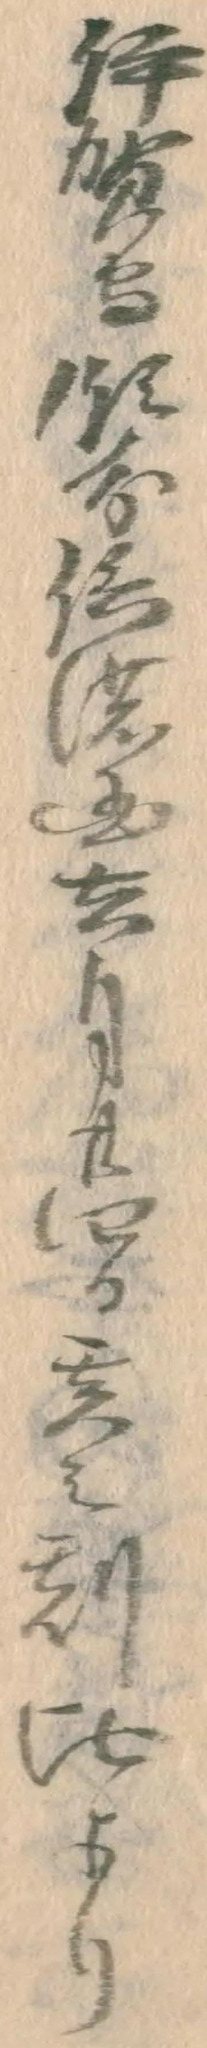伊賀守領分信濃国去廿四日亥之刻比より
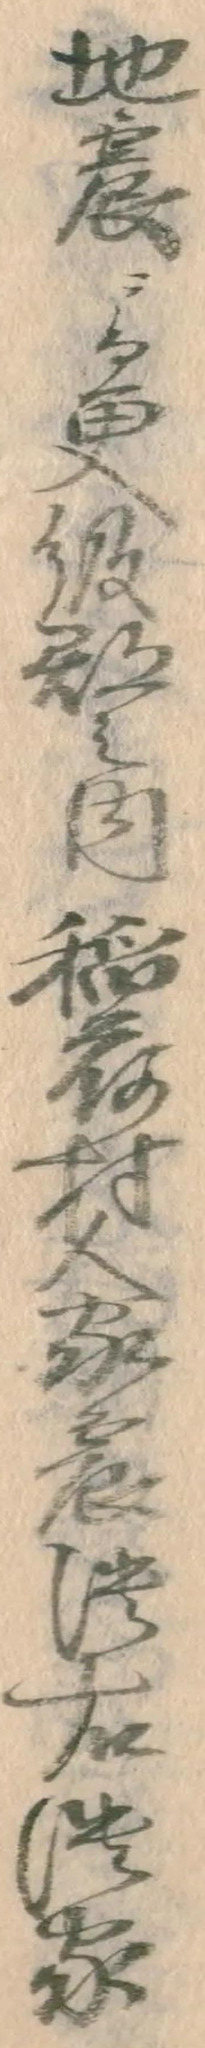地震ニ而更級郡之内稲荷村人家震潰右潰家
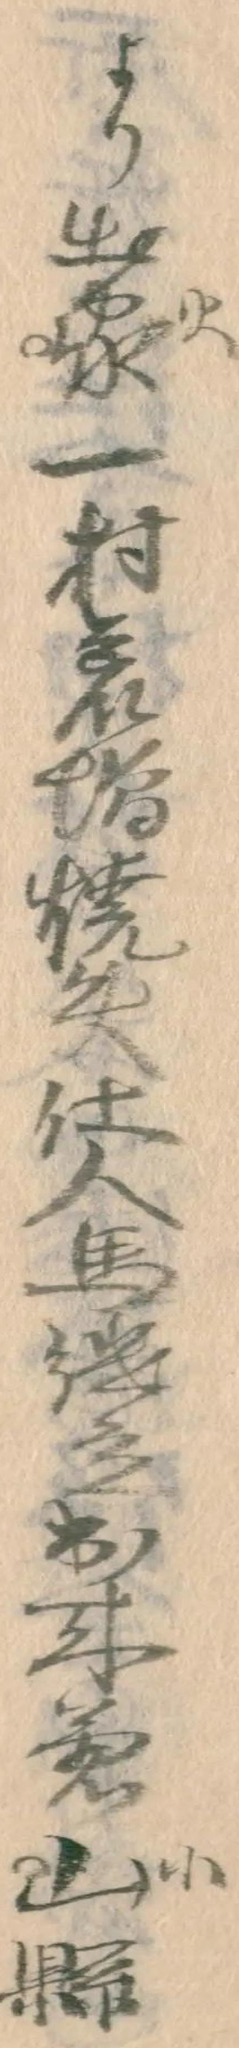より出火一村荒増焼失仕人馬継立出来兼小県
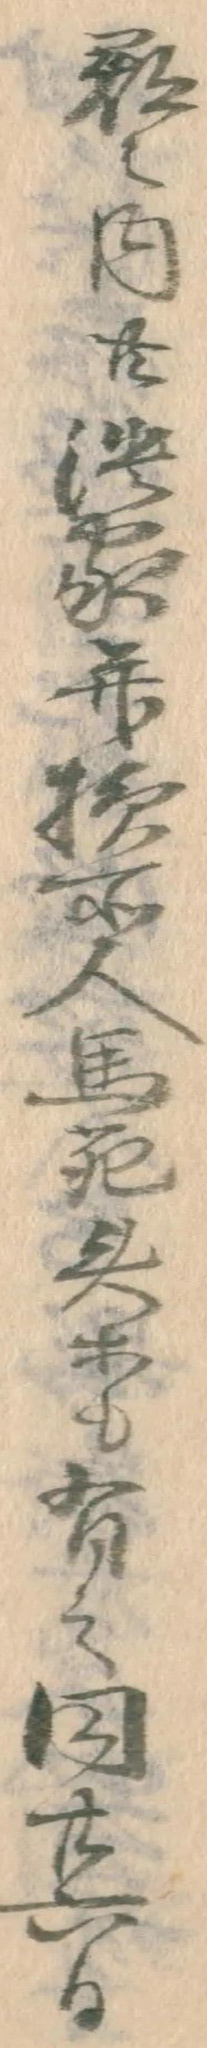郡之内共潰家并損所人馬死失等も有之同廿六日
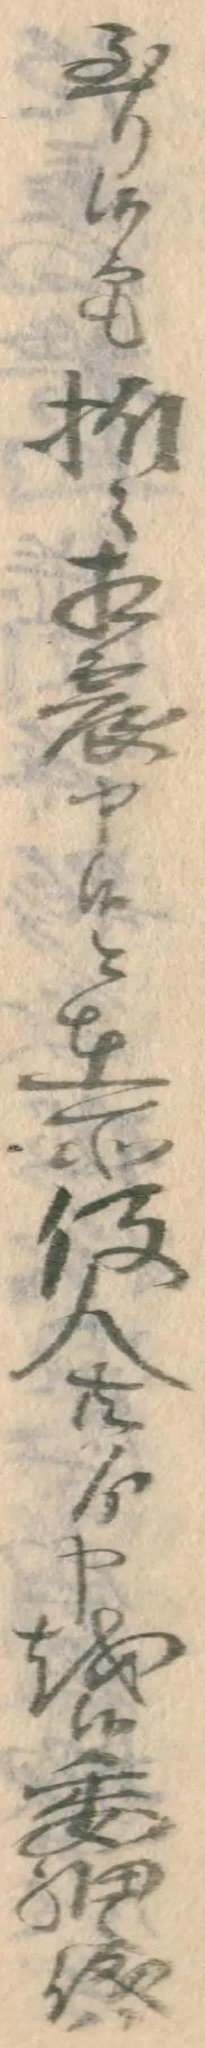至り候而も折々相震申候と在所役人共ゟ申越候委細之儀ハ
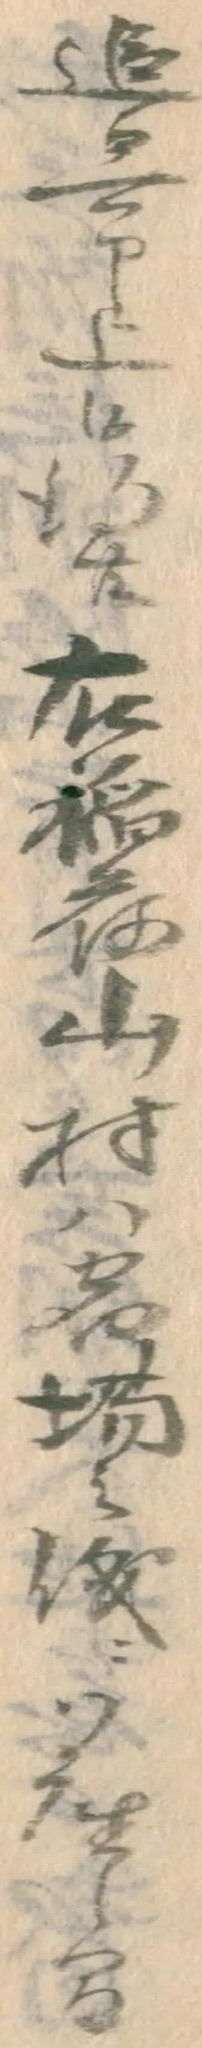追而可申上候得共右稲荷山村は宿場之儀ニ御座候間
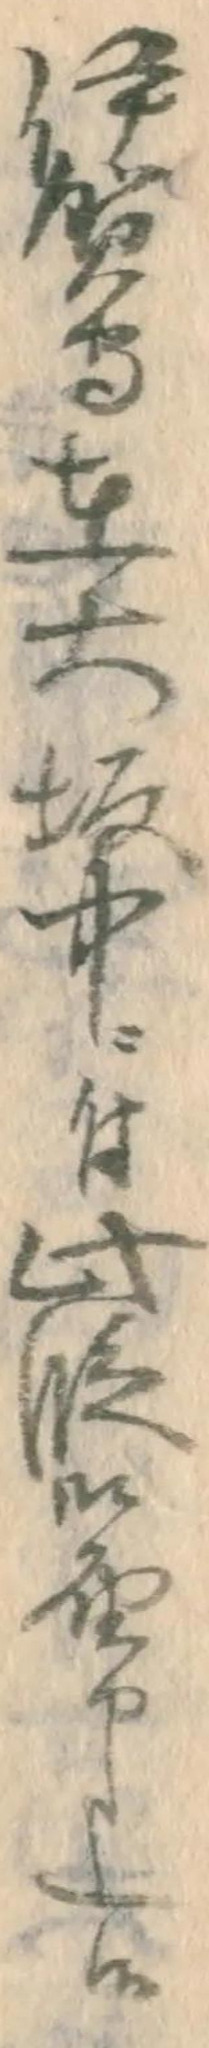伊賀守在大坂中ニ付此段御届申上候

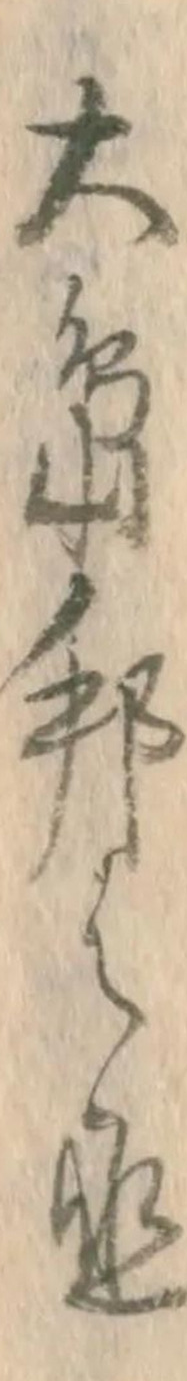大島邦之丞
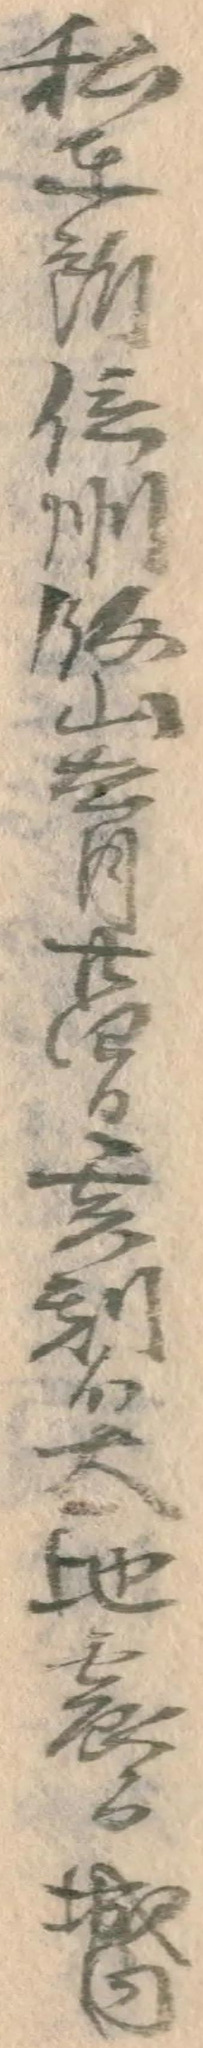私在所信州飯山去月廿四日亥刻ゟ大地震ニ而城内
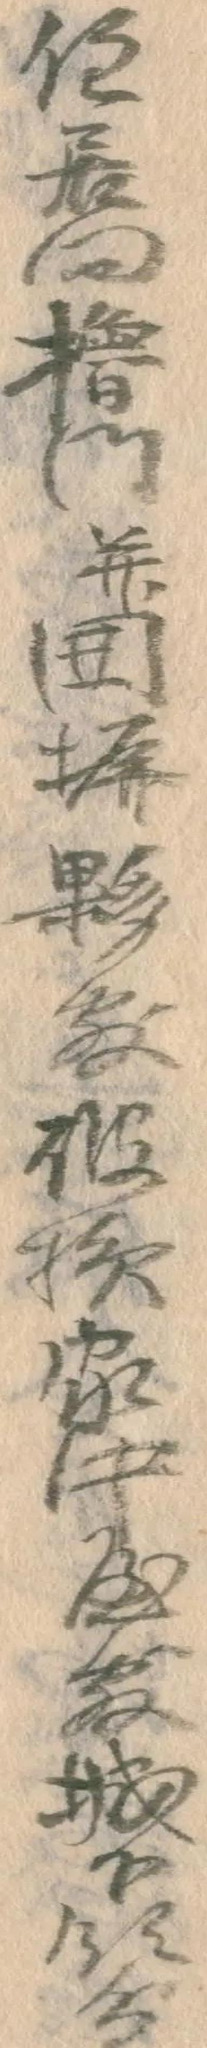住居向櫓門并囲塀夥敷破損家中屋敷城下領分
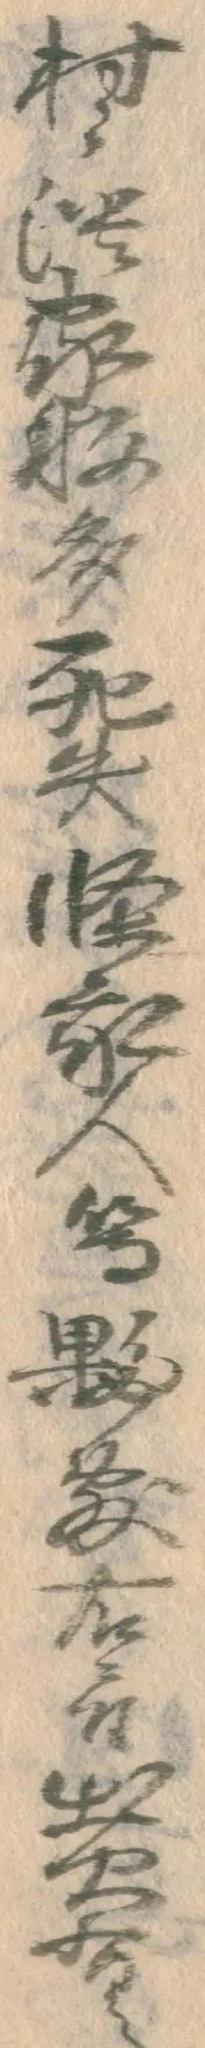村々潰家数多死失怪我人等夥敷右ニ付出火有之
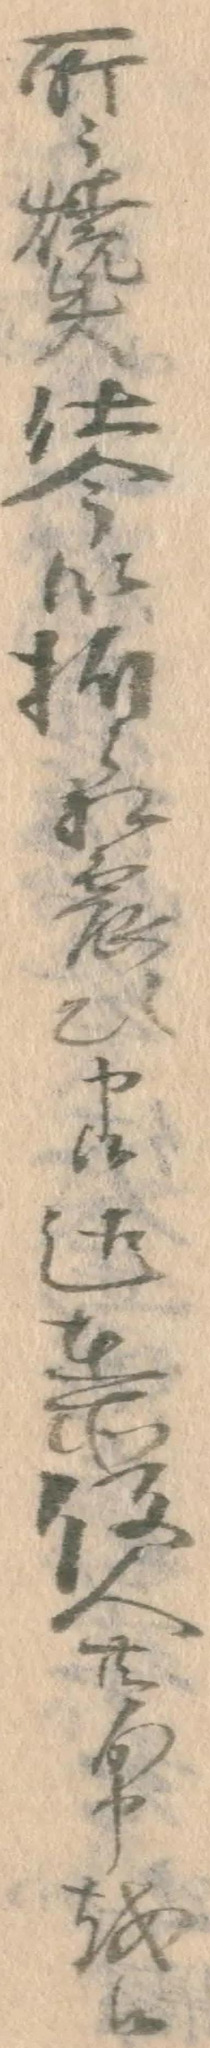所々焼失仕今以折々相震ひ申候趣在所役人共ゟ申越候
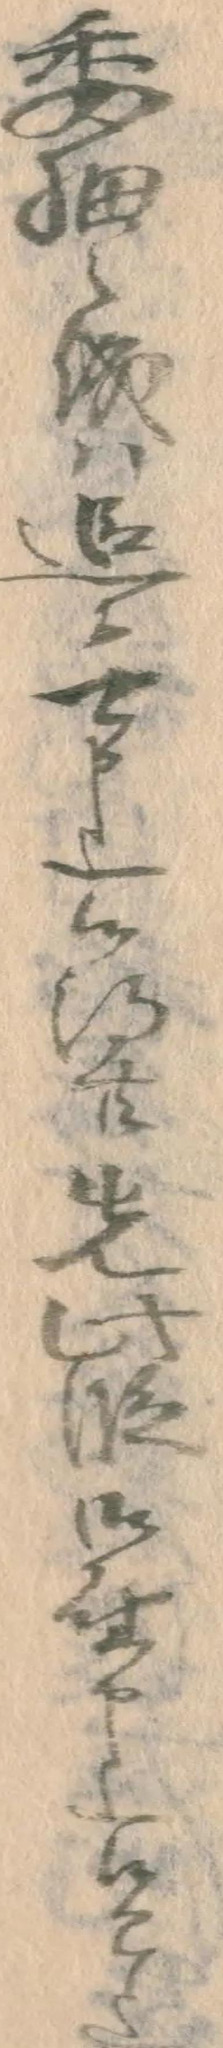委細之儀ハ追而可申上候得共先此段御届申上候已上
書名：信州大地震之記
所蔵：国立国会図書館 National Diet Library, JAPAN
